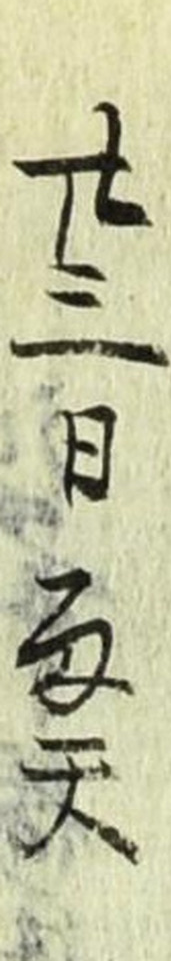廿三日雨天
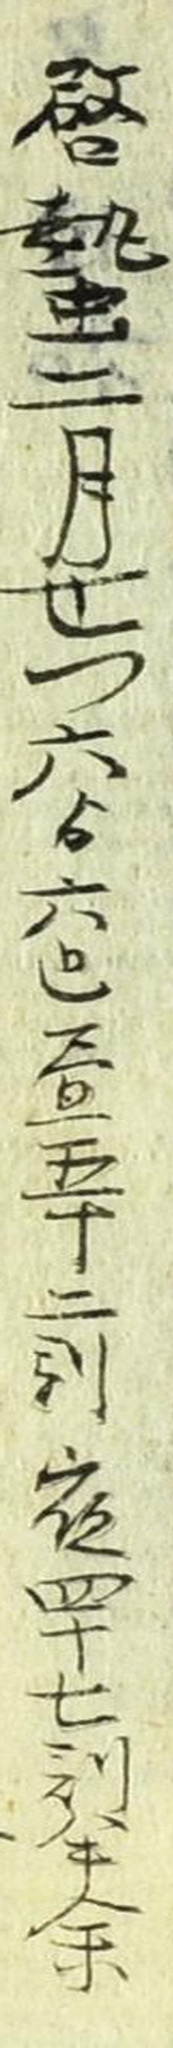啓蟄二月せつ六ゟ六迄昼五十二刻夜四十七刻半余
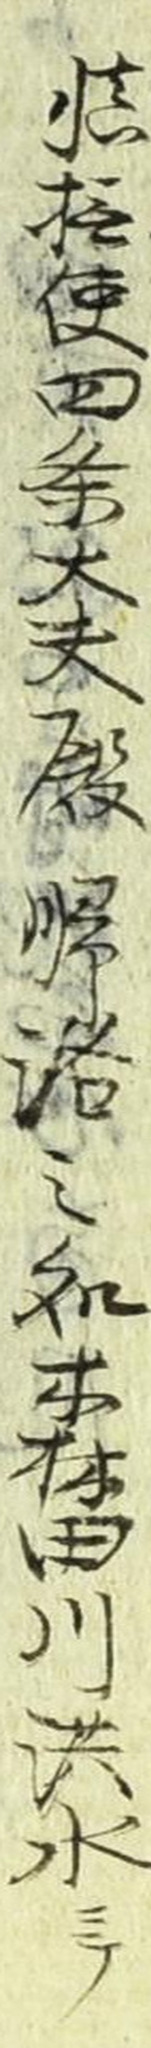慎撫使四条大夫殿帰洛之処森田川洪水にて
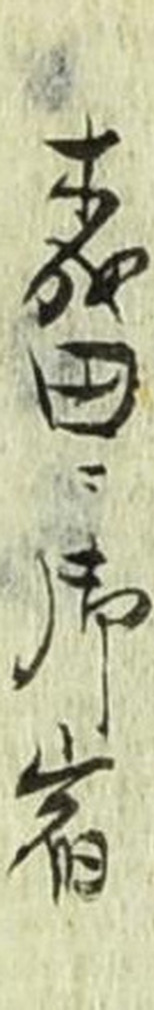森田に御宿
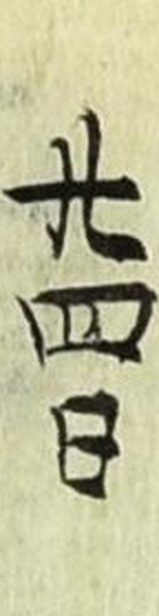廿四日
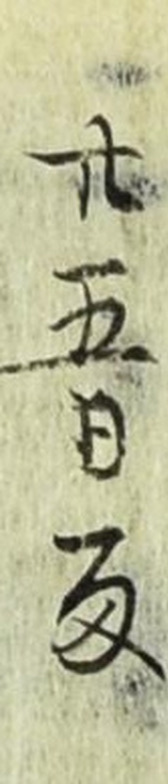廿五日雨
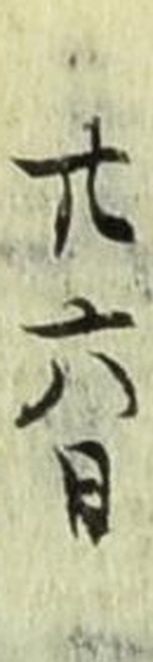廿六日
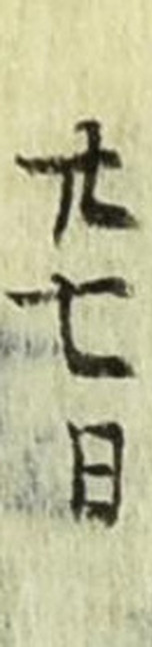廿七日
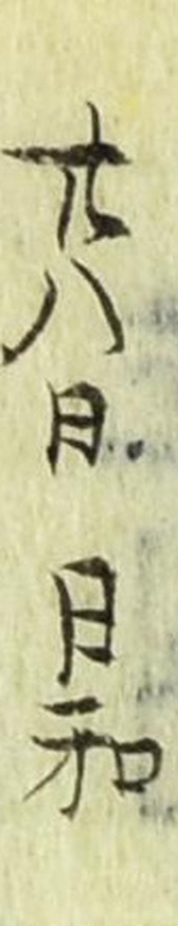廿八日日和
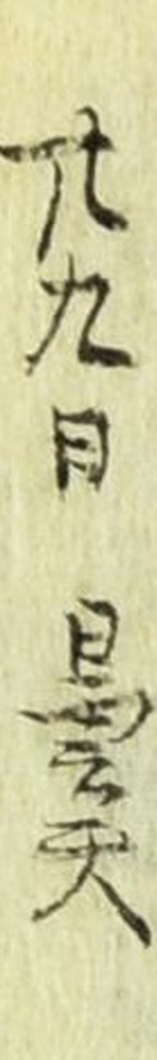廿九日曇天
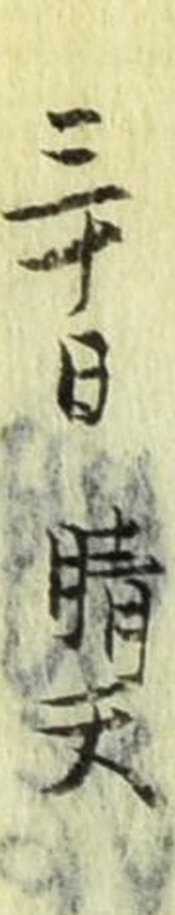三十日晴天

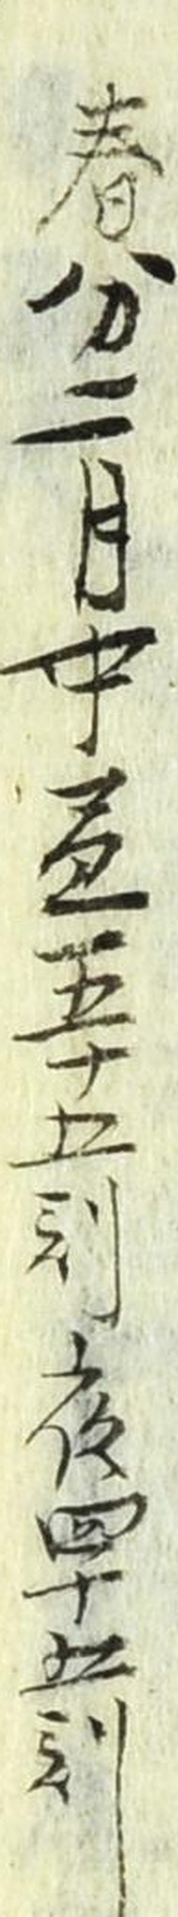春分二月中昼五十五刻夜四十五刻
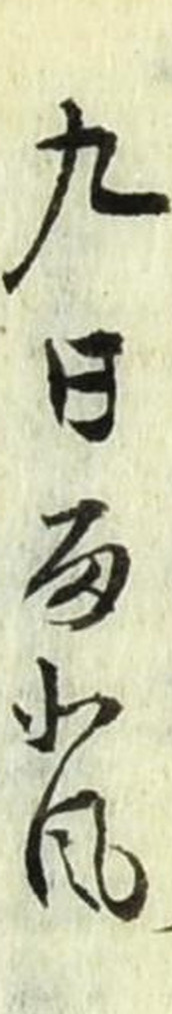九日雨北風
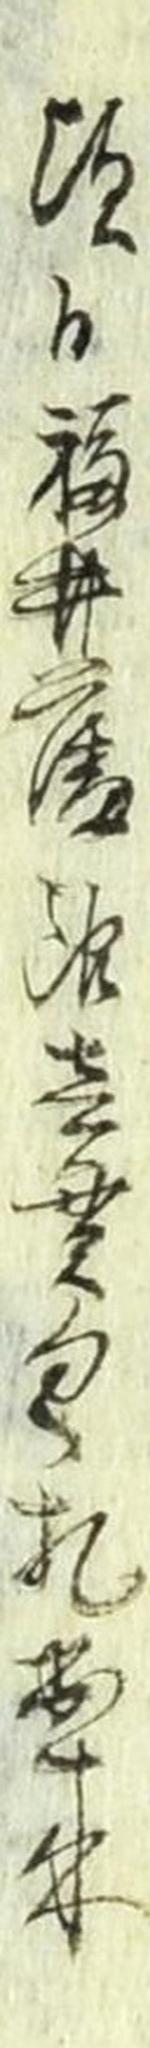頃日福井藩銀壱貫匁札出来
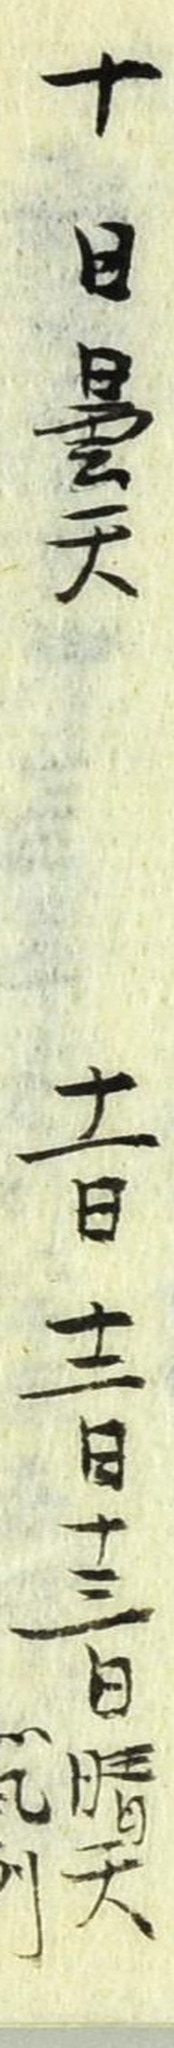十日曇天十一日十二日十三日晴天
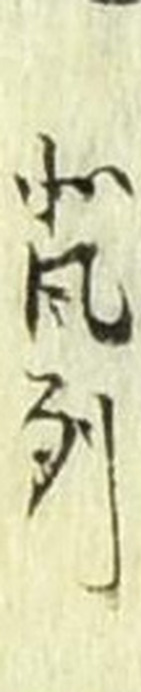北風列
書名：（日記）
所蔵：福井県文書館 Fukui Prefectural Archives
